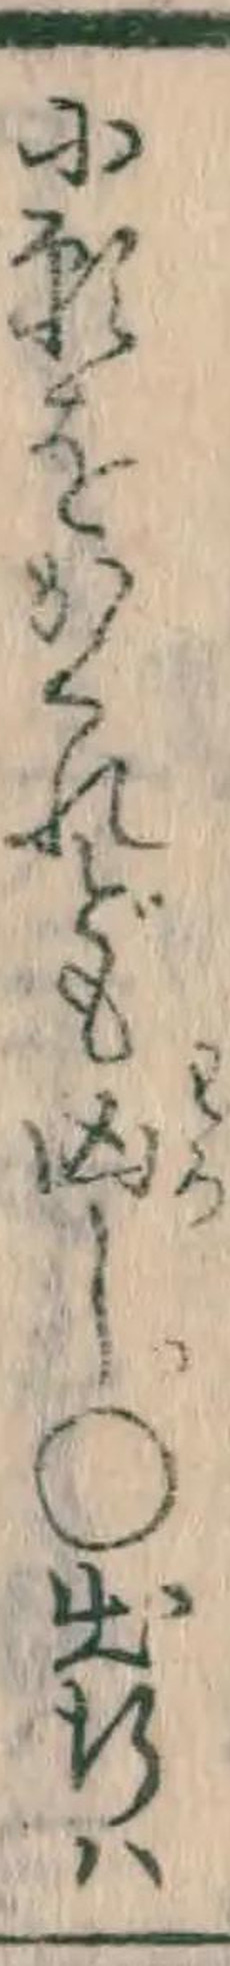に願をかくれども凶し○出行は
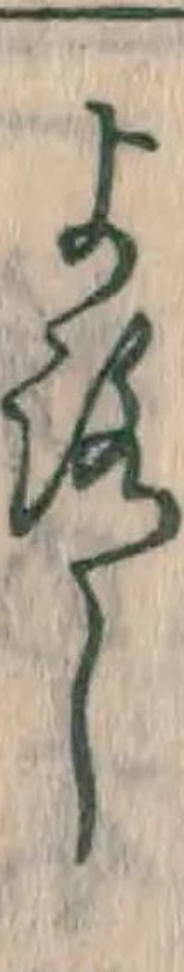よろし
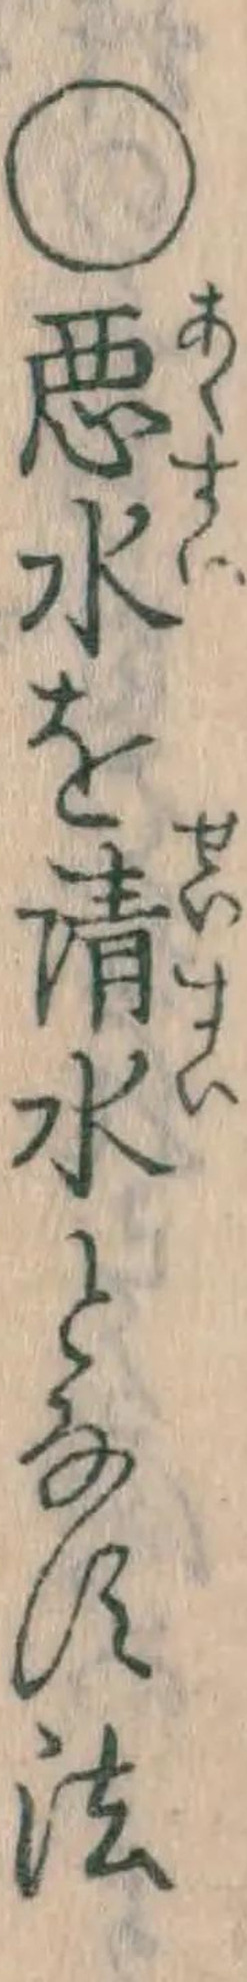○悪水を清水となす法
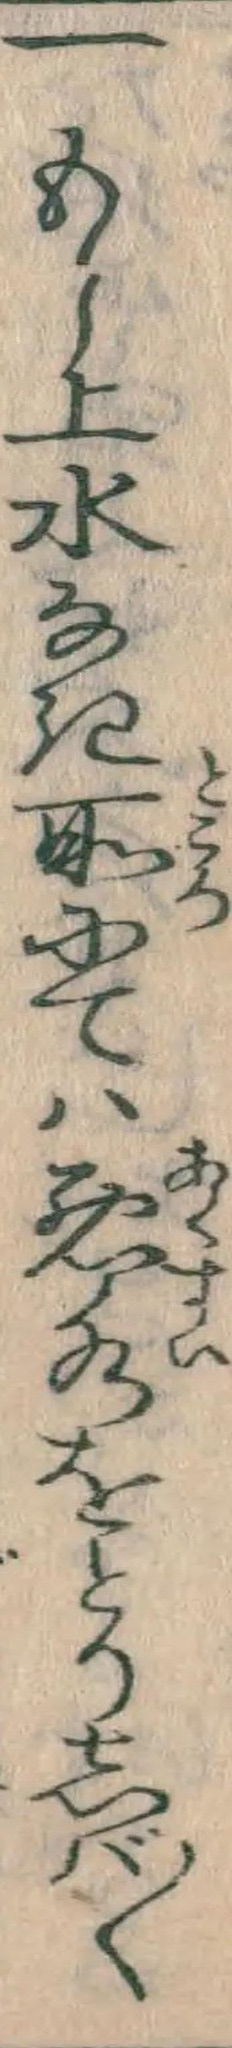一もし上水なき所にては悪水をとりしば〳〵
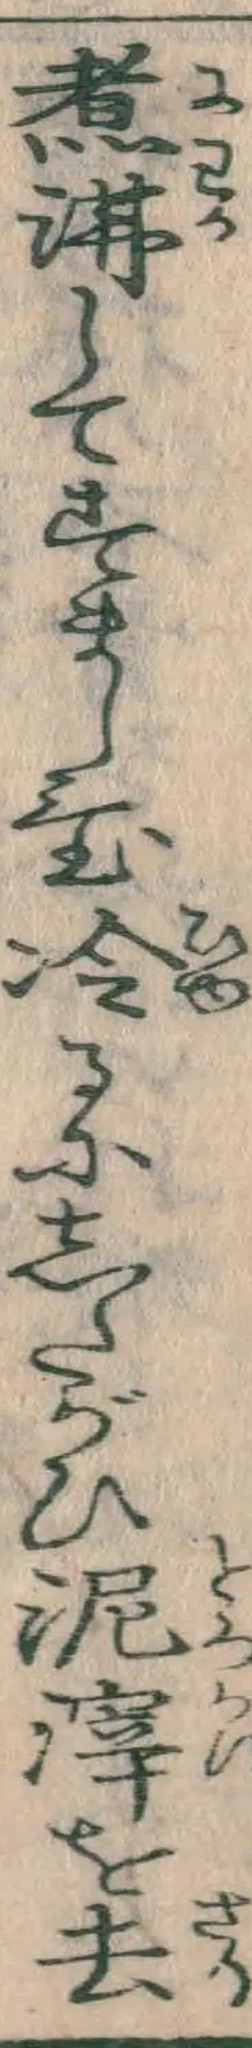煮沸してすまし置冷るにしたがひ泥滓を去
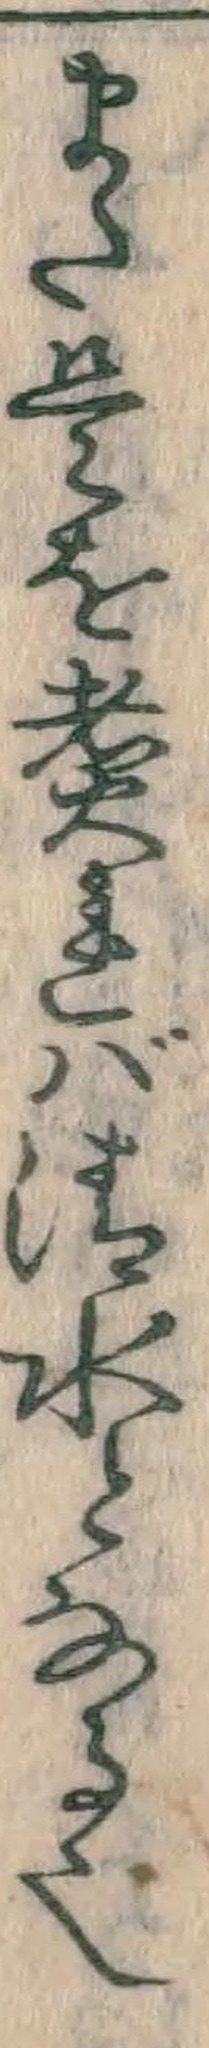また是を煮れば清水となる也
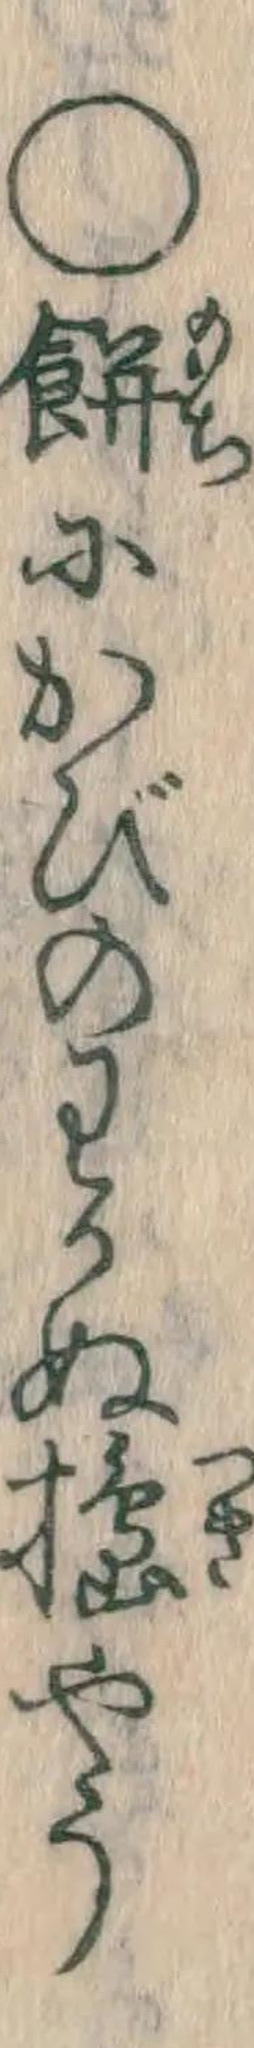○餅にかびのわかぬ搗やう
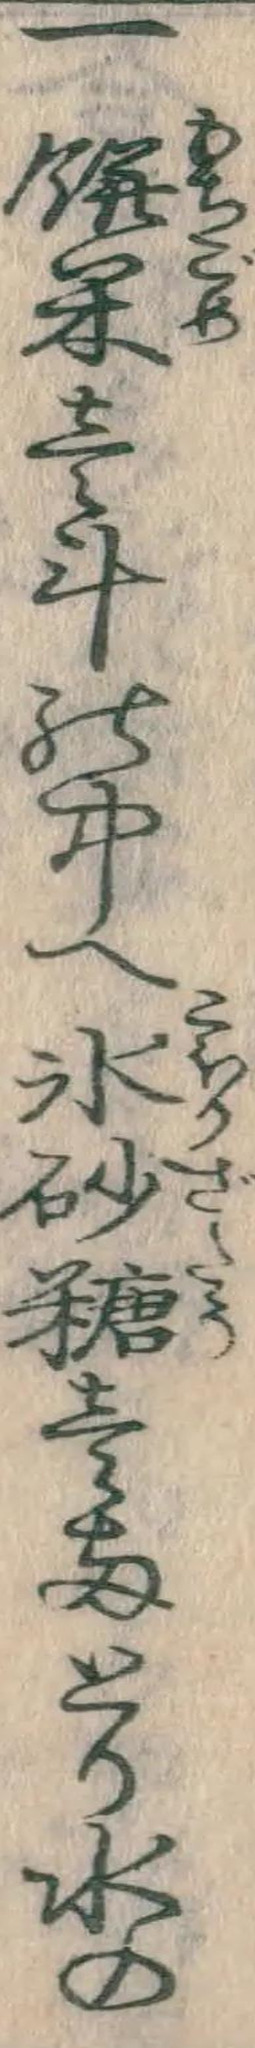一餅米壱斗の中へ氷砂糖壱両とり水の
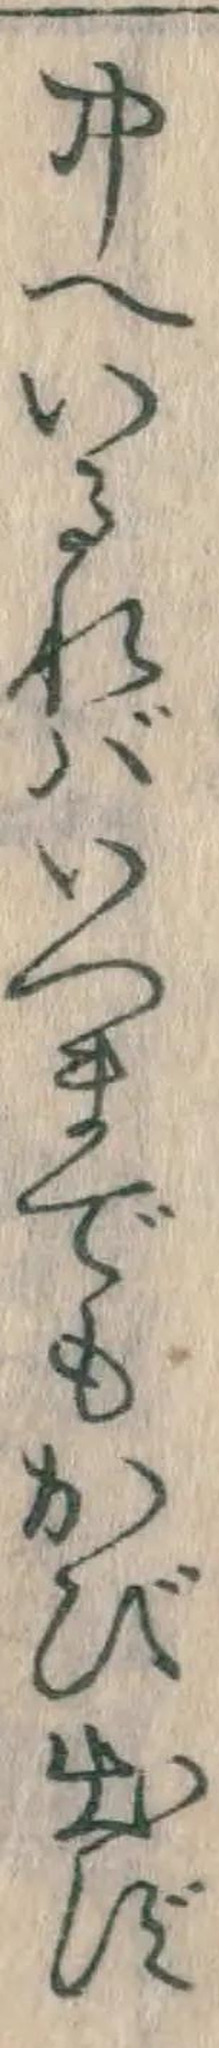中へいるればいつまでもかび出ず
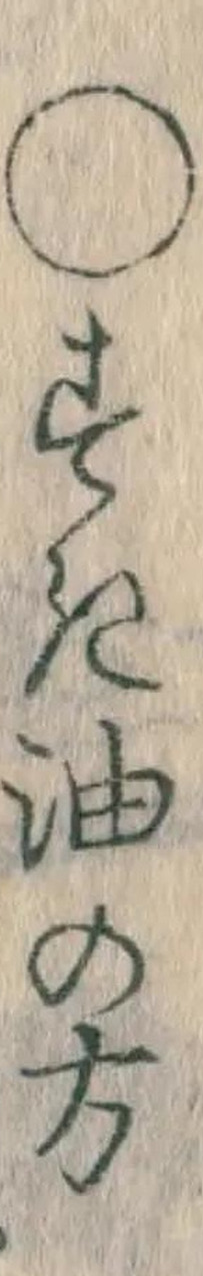○すき油の方
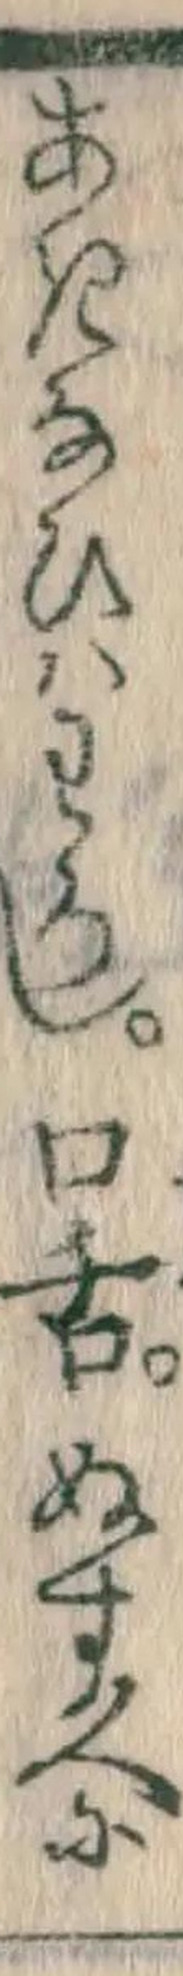あきなひはわろし。口舌。ぬす人に
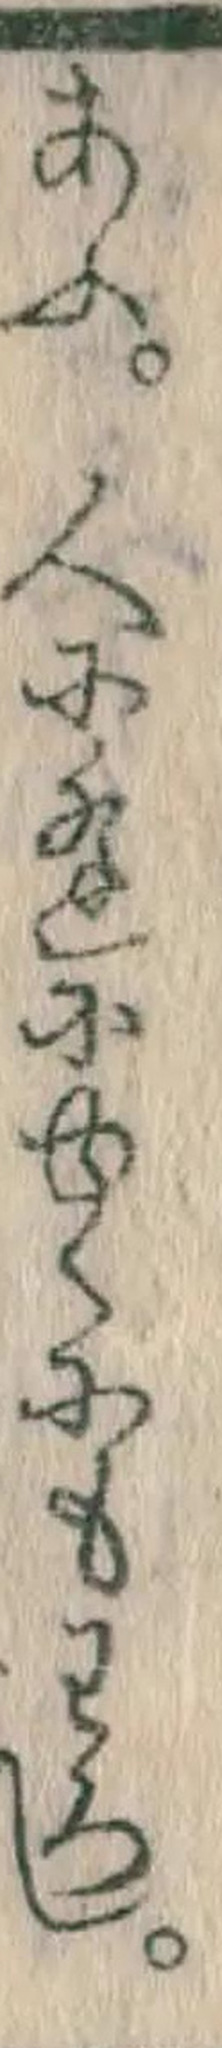あふ。人に逢にゆくにもわろし。
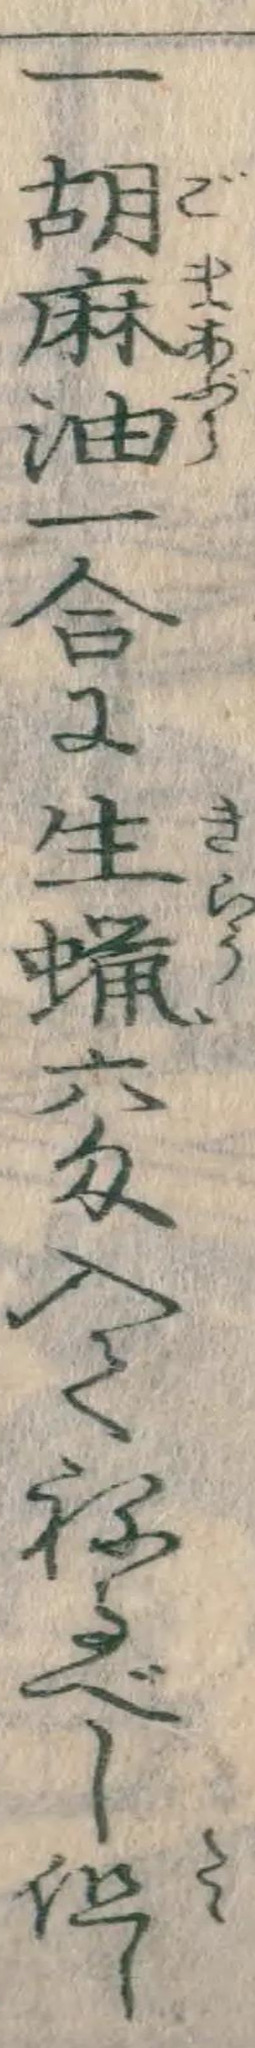一胡麻油一合に生蠟六匁入てねるべし但し
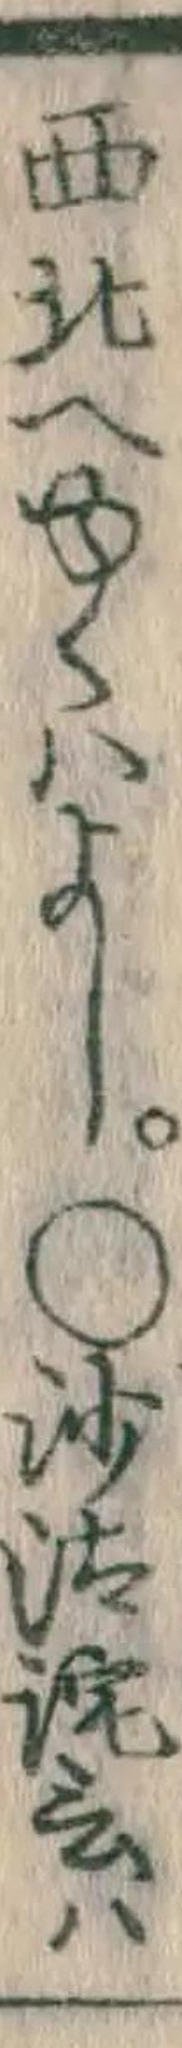西北へゆくはよし。○沙汰詫言は
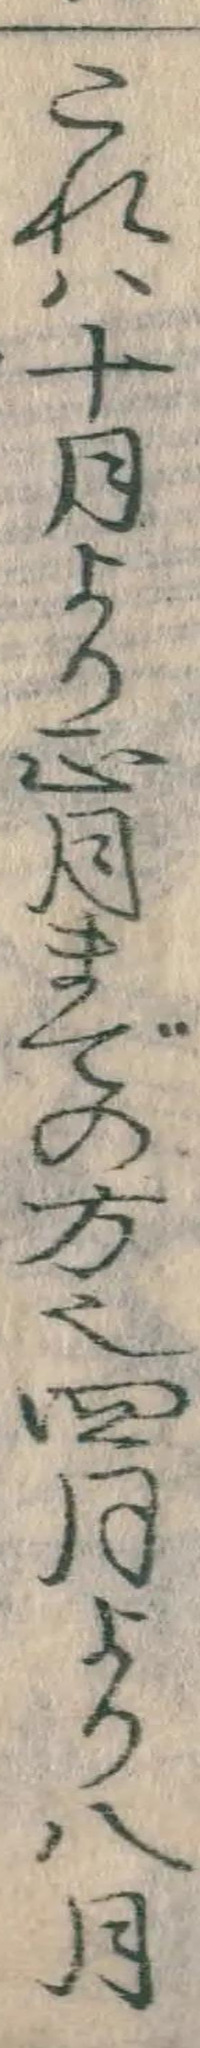これは十月より正月までの方也四月より八月
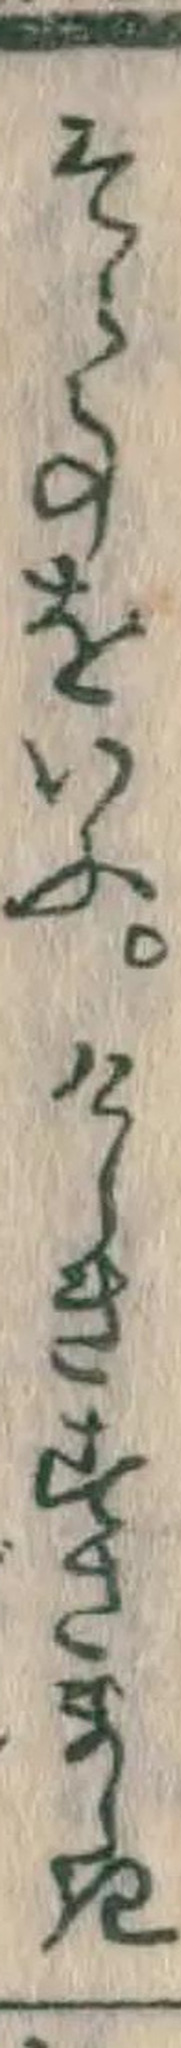そら事をいふ。けしきすさましき
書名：広益秘事大全 3巻. [1]
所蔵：国立国会図書館 National Diet Library, JAPAN
